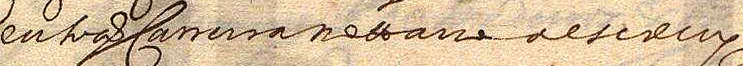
eu Ioaõ Carreira nottario o escreuy
